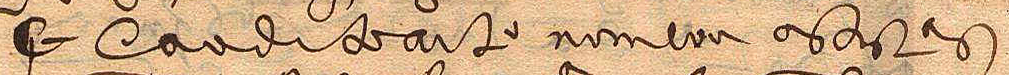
& e ao dito arto nomeou as testas
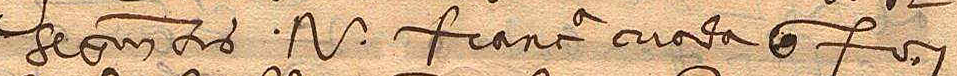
seḡuytes .ss. franca criada q̄ foy
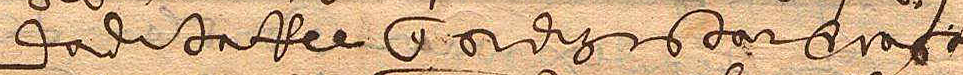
da dita Ree q̄ se diz estar ē casa
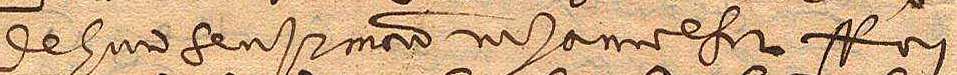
de hūu seu Jrmão cuJa molher ffoy
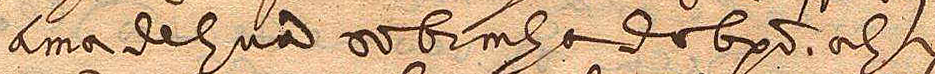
ama de huā sobrinha do bp̄o ahy
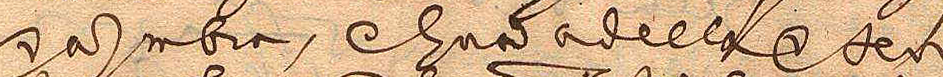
ē coJmbra, e huā a della ē ten
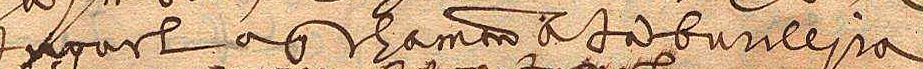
tugueL a q̄ chamão a tāburilejra
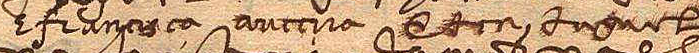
E francisca couceira ē tentugueL
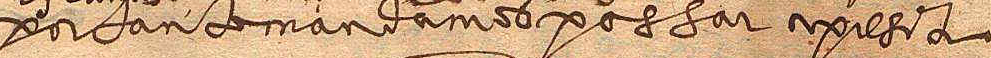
portanto mandamos passar a presēte
